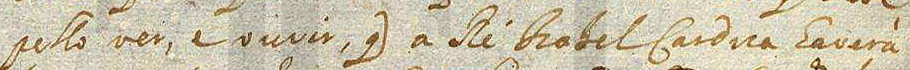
pello ver, e ouvir, q̄ a Ré Izabel Cardoza haverá
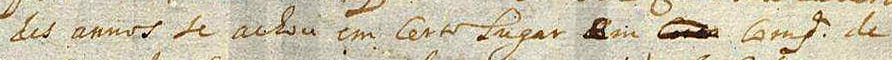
des annos se achou em certo Lugar em _ comp.a de
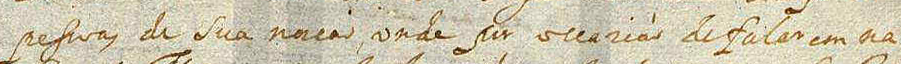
pessoas de sua naçaõ, onde por occaziaõ de falarem na
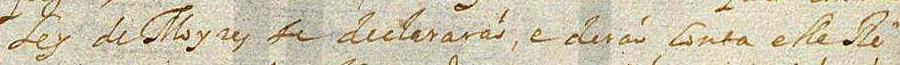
Ley de Moyzes se declararaõ, e deraõ Conta ella Ré
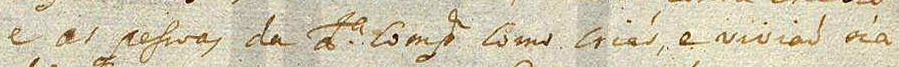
e as pessoas da d̄a compa como criaõ, e viviaõ na
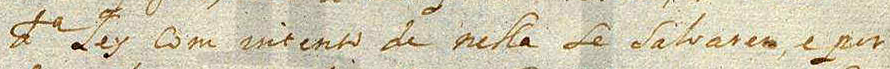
d̄a Ley com intento de nella se salvarem, e per
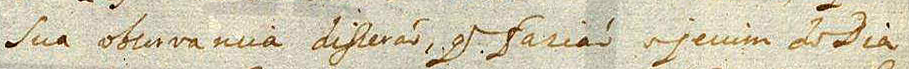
sua observancia disseraõ, q̄ faziaõ o jeium do Dia
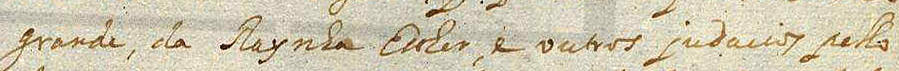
grande, da Raynha Esther, e outros judaicos pello
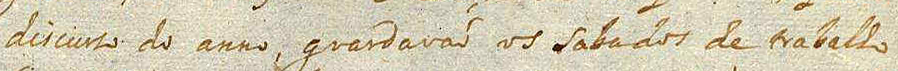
discurso do anno, guardavaõ os sabados de trabalho
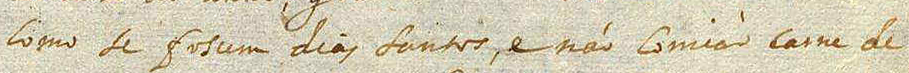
como se fossem dias santos, e não comiaõ carne de
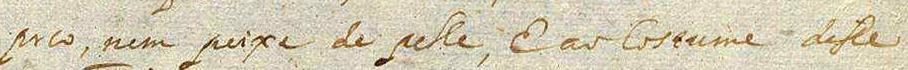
prco, nem peixe de pelle, E ao costume disse
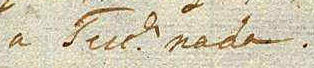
a Test.a nada.
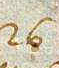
26
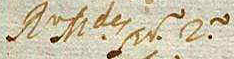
Ro M.des pr.o 2.o
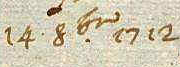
14 8.bro 1712
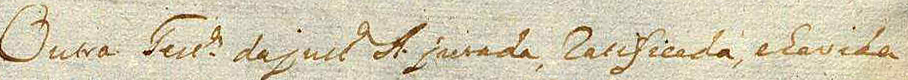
Outra Test.a da justa A. jurada, Ratificada, e havida
